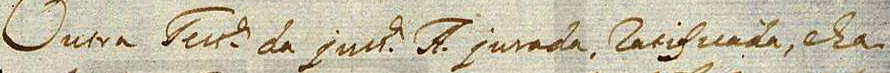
Outra Test.a da just.a A. jurada, Ratificada, e ha
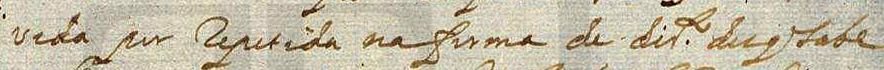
vida per Repetida na forma de dir.to dis q̄ sabe
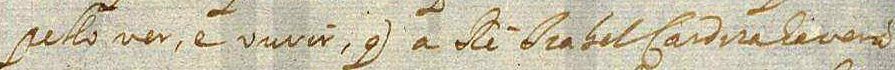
pello ver, e ouvir, q̄ a Ré Izabel Cardoza haverá
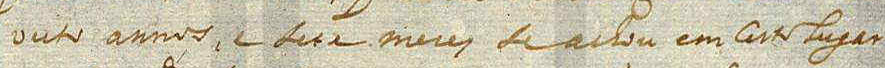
outo annos, e sete mezes se achou em certo Lugar
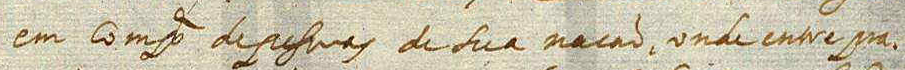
em comp.a de pessoas de sua naçaõ, onde entre pra
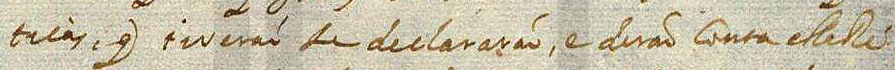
ticas, q̄ tiveraõ se declararaõ, e deraõ Conta elle Re
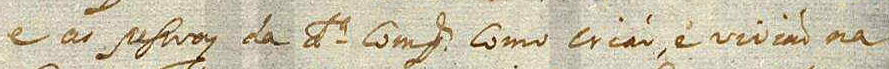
e as pessoas da d̄a comp.a como criaõ, e viviaõ na
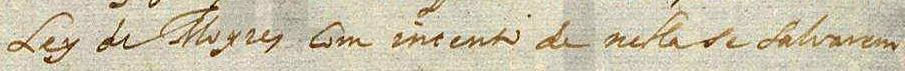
Ley de Moyzes com intento de nella se salvarem
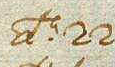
d̄.a 22
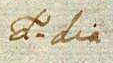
d̄. dia
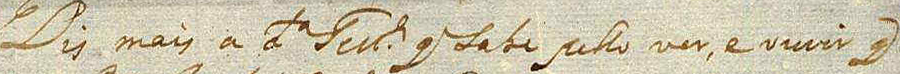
Dis mais a d̄a Test.a q̄ sabe pello ver, e ouvir q̄
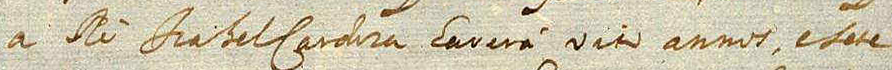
a Ré Izabel Cardoza haverá oito annos, e sete
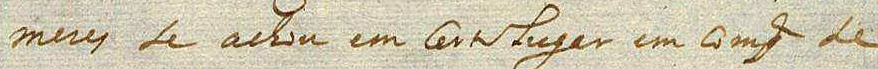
mezes se achou em Certo Lugar em compa de
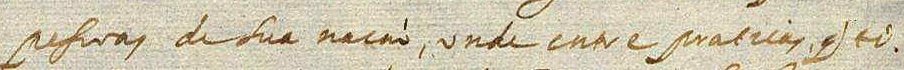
pessoas de sua naçaõ, onde entre praticas q̄ ti
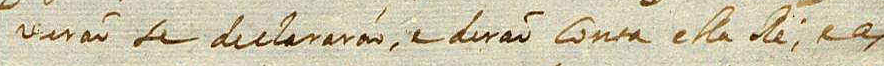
veraõ se declararaõ, e deraõ Conta ella Ré, e as
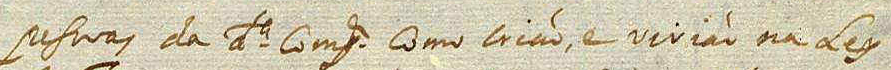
pessoas da d̄.a Comp.a como criaõ, e viviaõ na Ley
